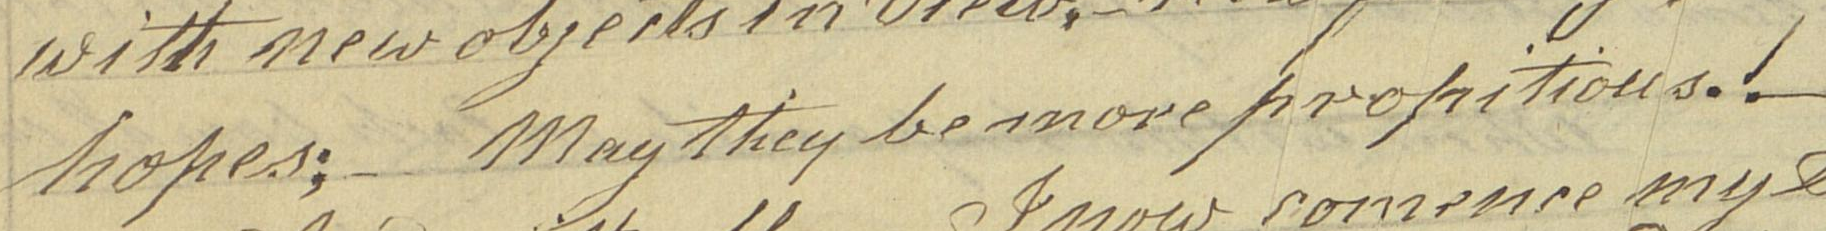hopes; May they be more propitious!
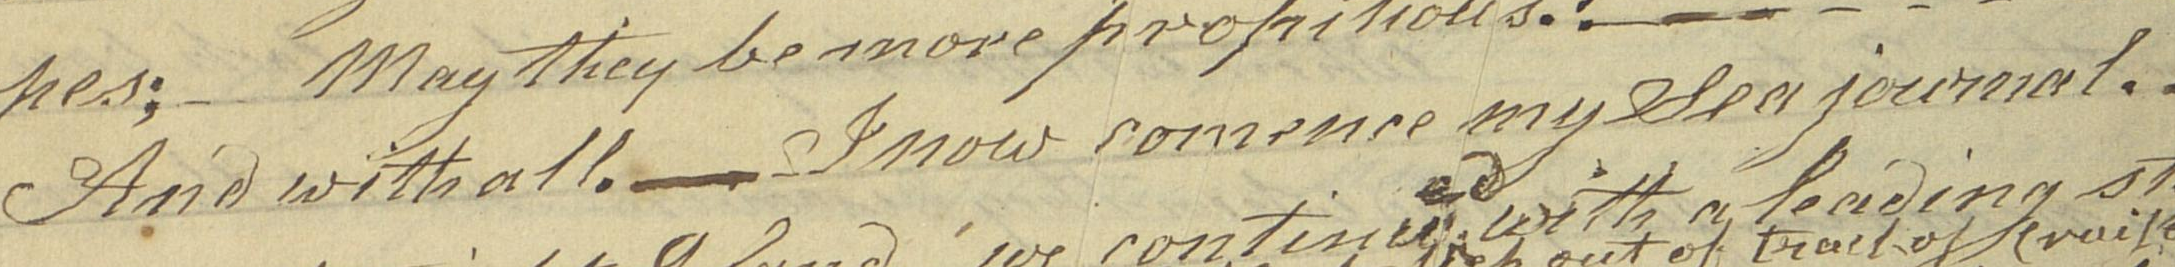And with all. I now comence my Sea journal
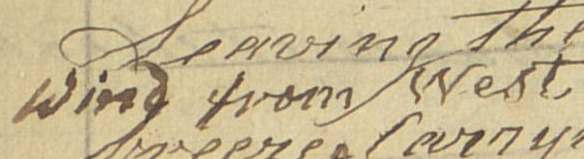wind from West
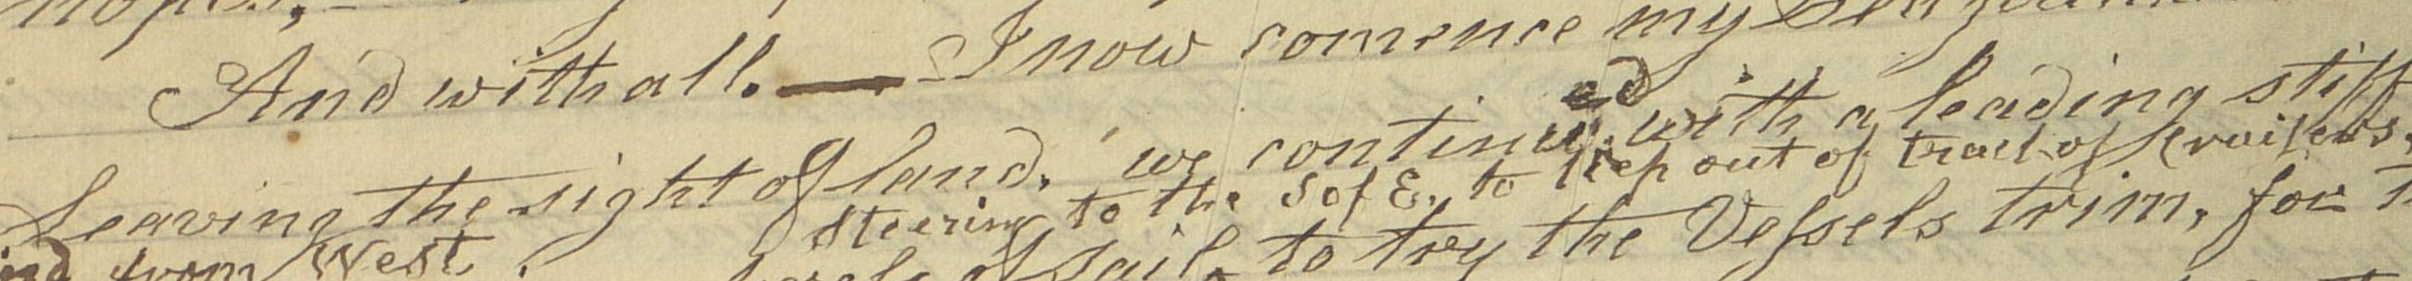Leaving the sight of sand. we continu^ed with a leading stiff
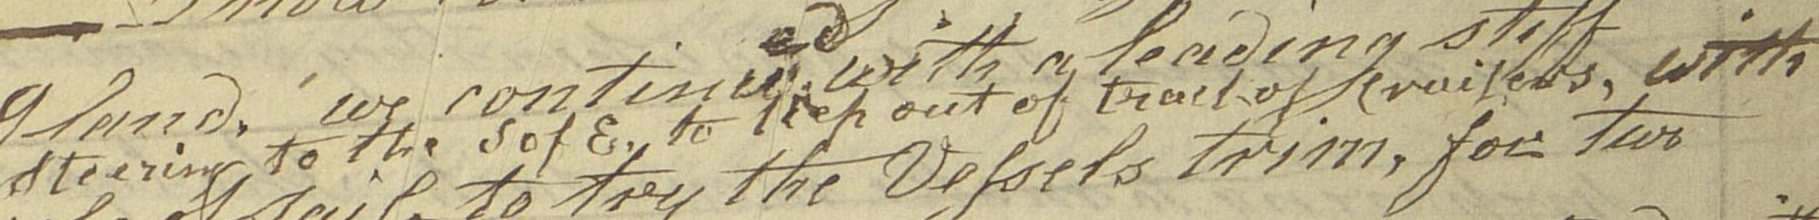steering to the So/E, to keep out of tract of Cruisers, with
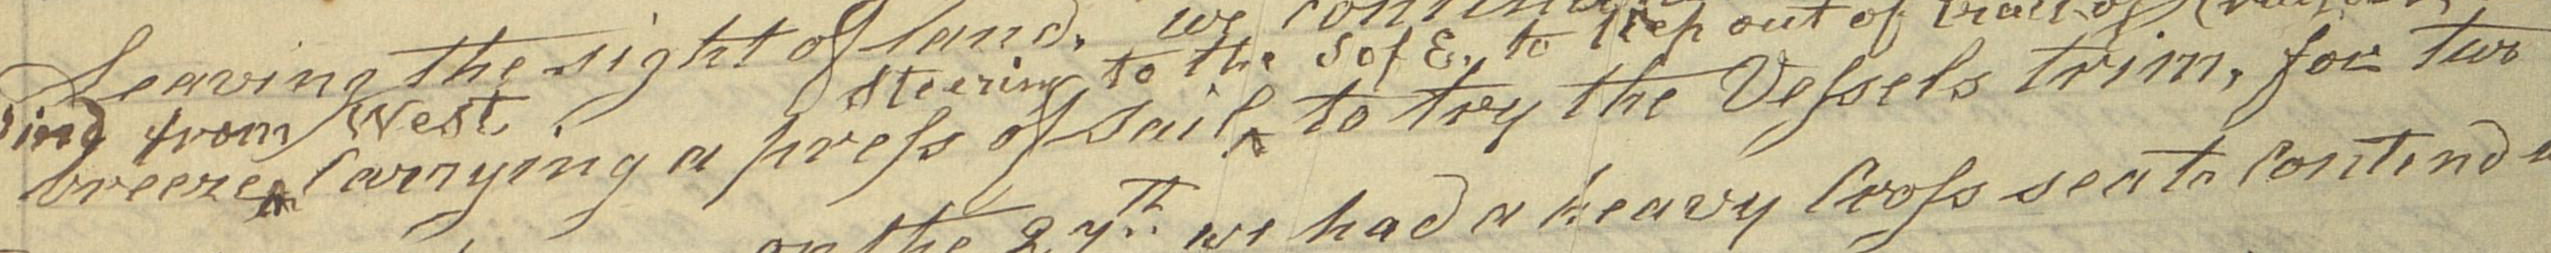breeze ^ Carrying a press of sail ^ to try the Vessels to trim, for two
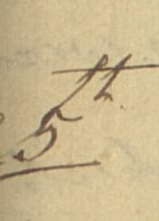5^th
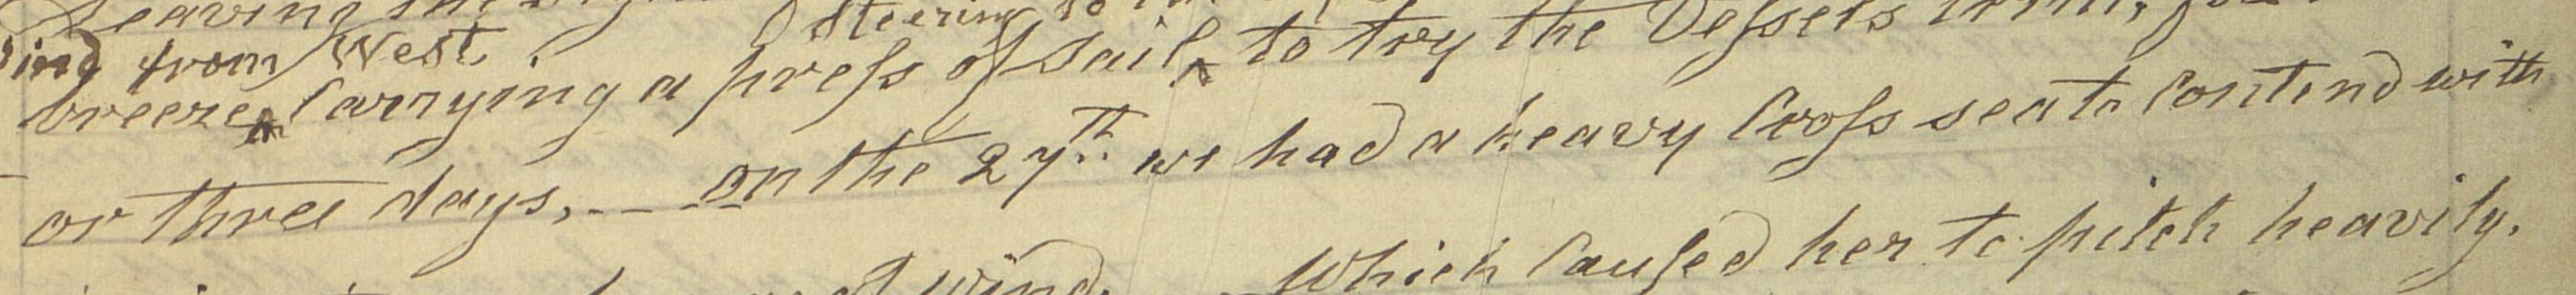or three days, on the 27^th. we had a heavy Cross sea to contend with
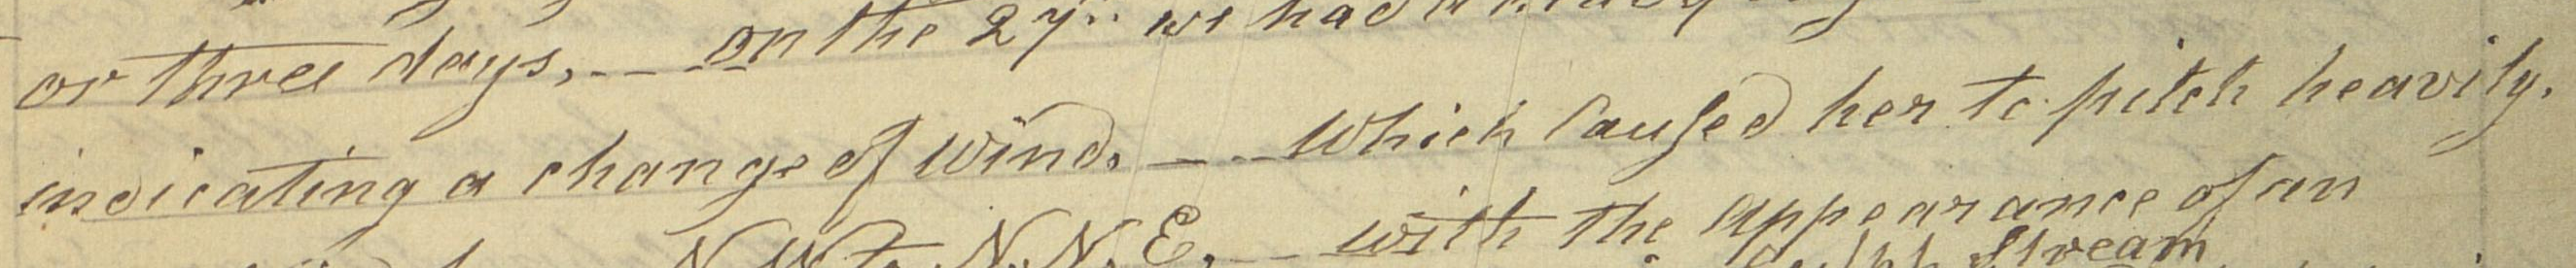indicating a change of wind. Which Caused her to pitch heavily
